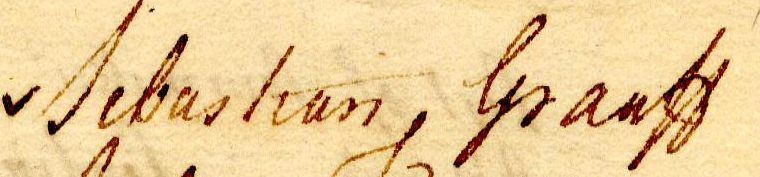Sebastian Graaff
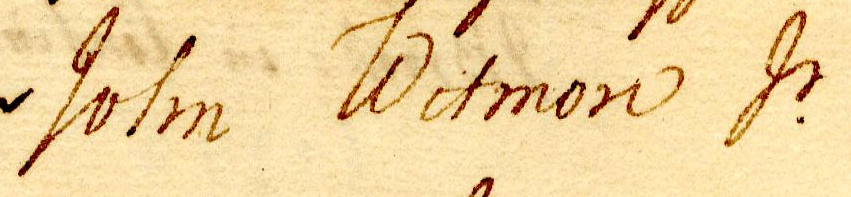John Witmore Jr.
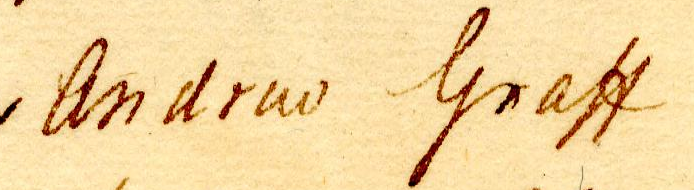Andrew Graff
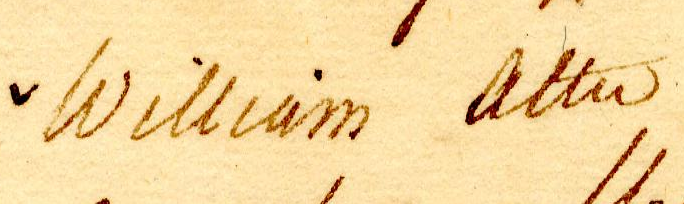William Attee
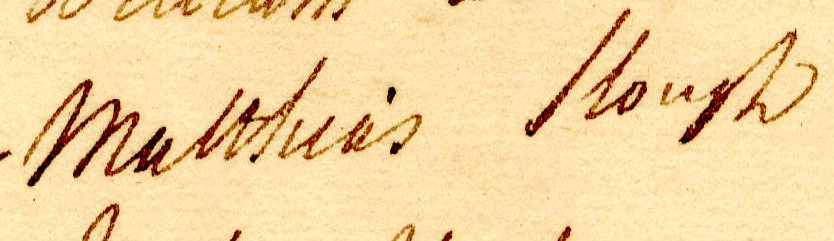Matthias Slough
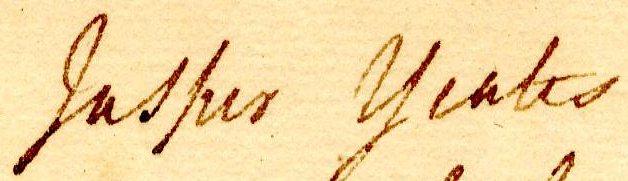Jasper Yeates
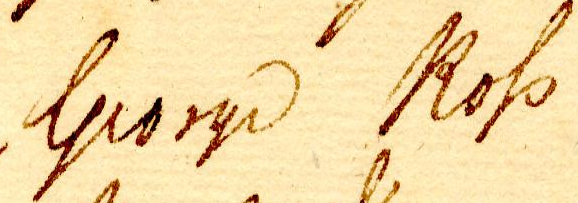George Ross
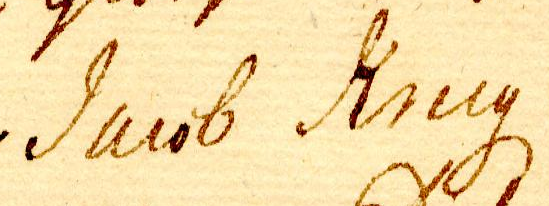Jacob Krecy
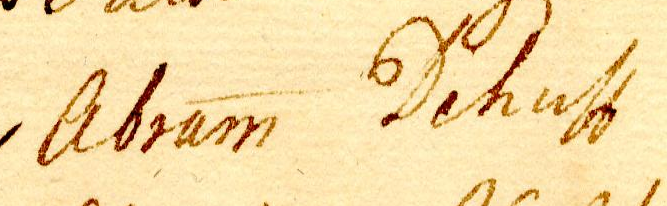Abram Dehuff
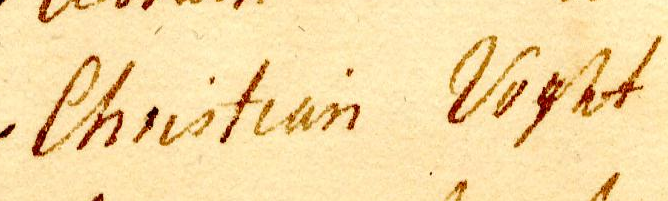Christian Voght
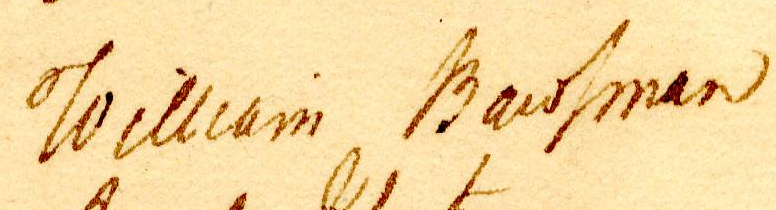William Bawsman
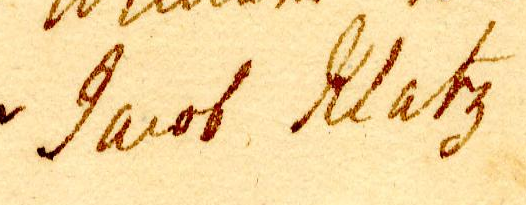Jacob Klatz
